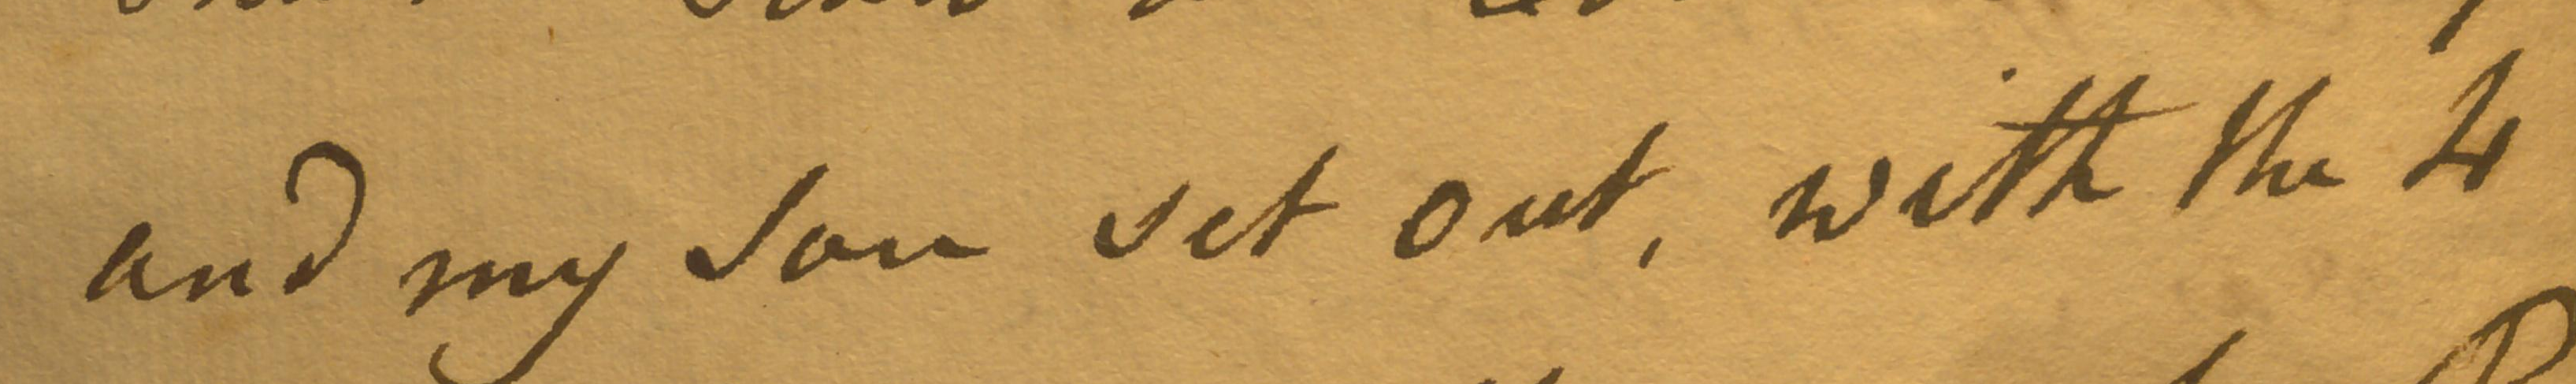and my son set out, with the 4
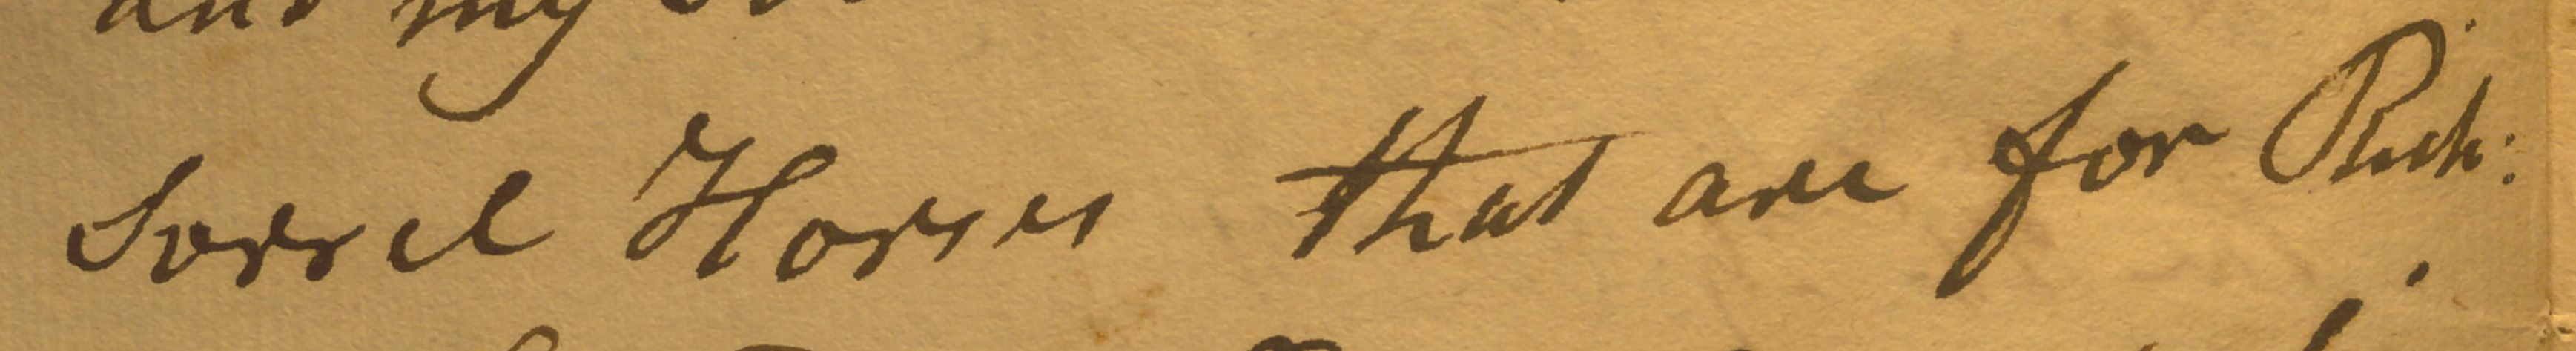sorrel Horses that are for Rick:
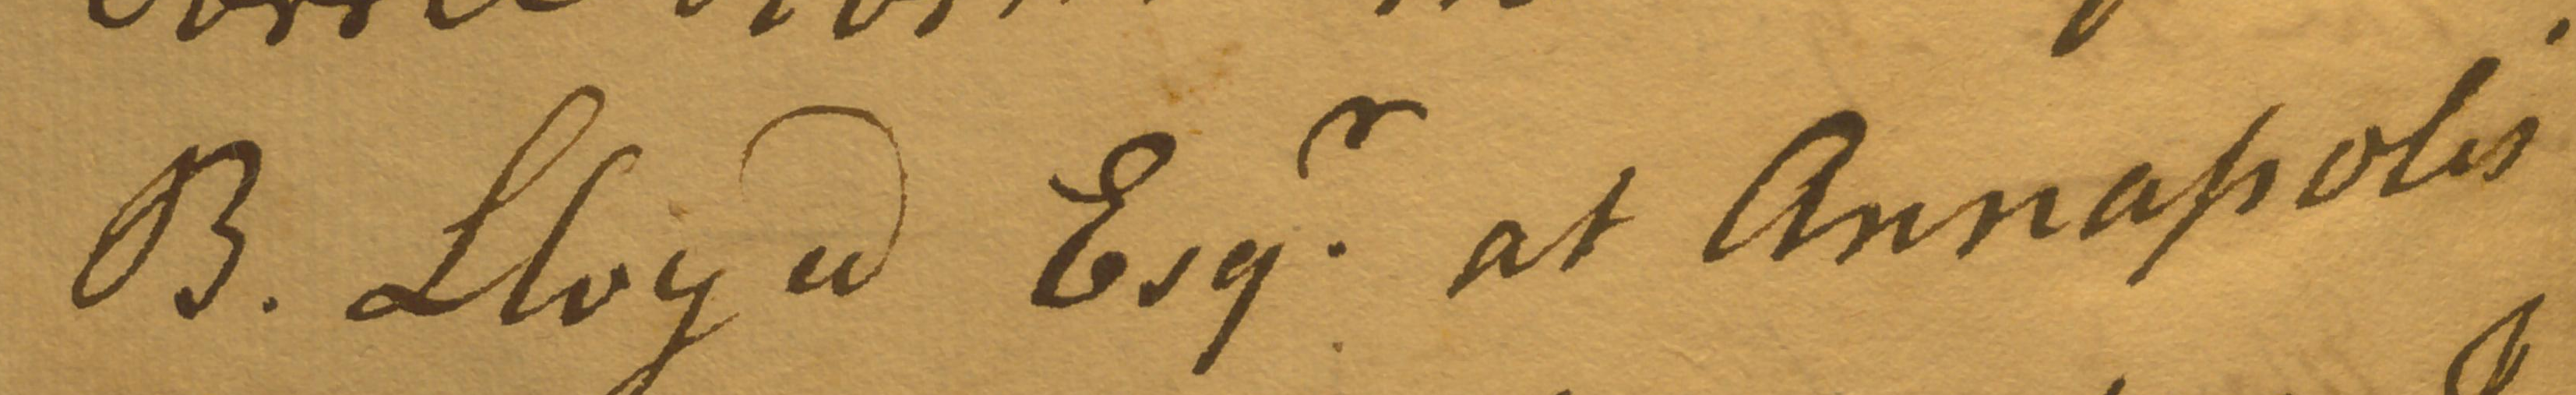B. Lloyed Esq^r. at Annapolis
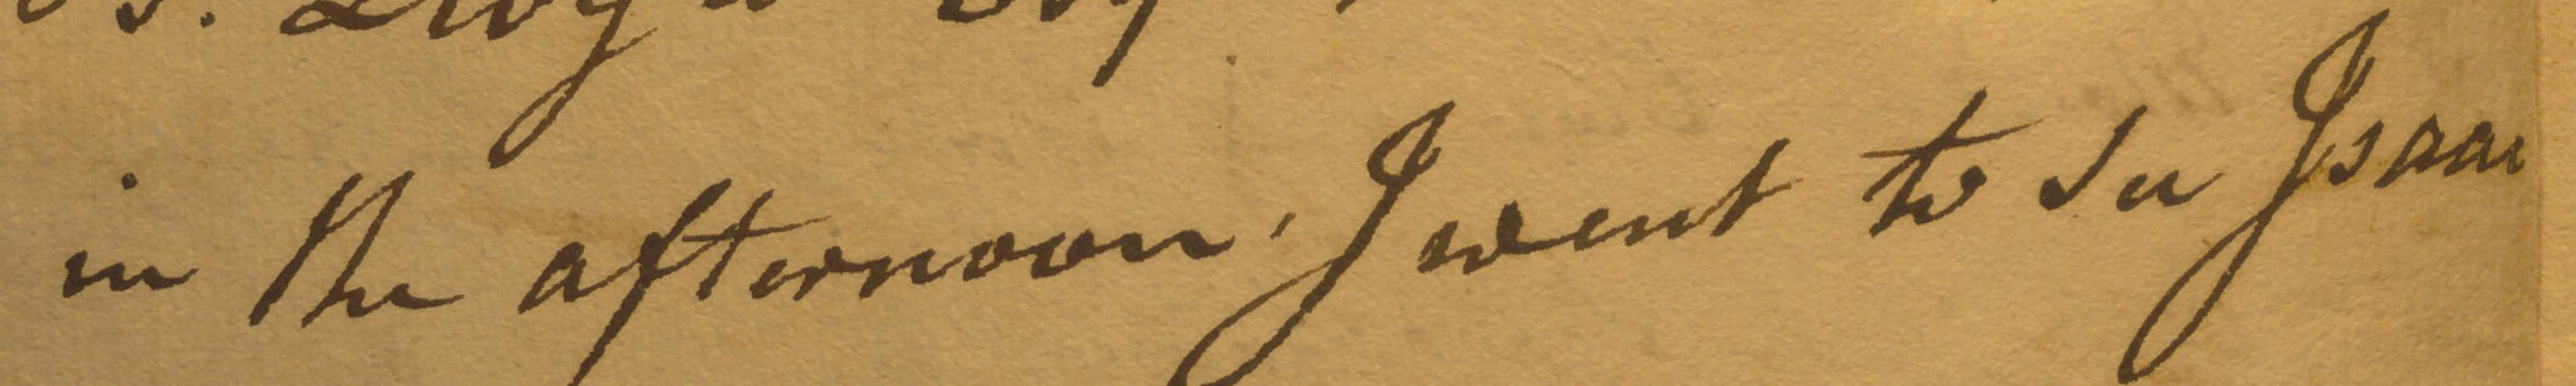in the afternoon. I went to see Isaac
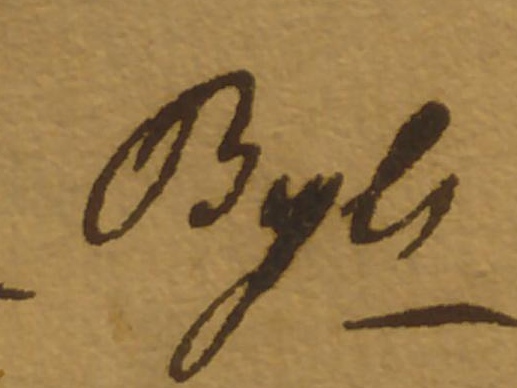Byls
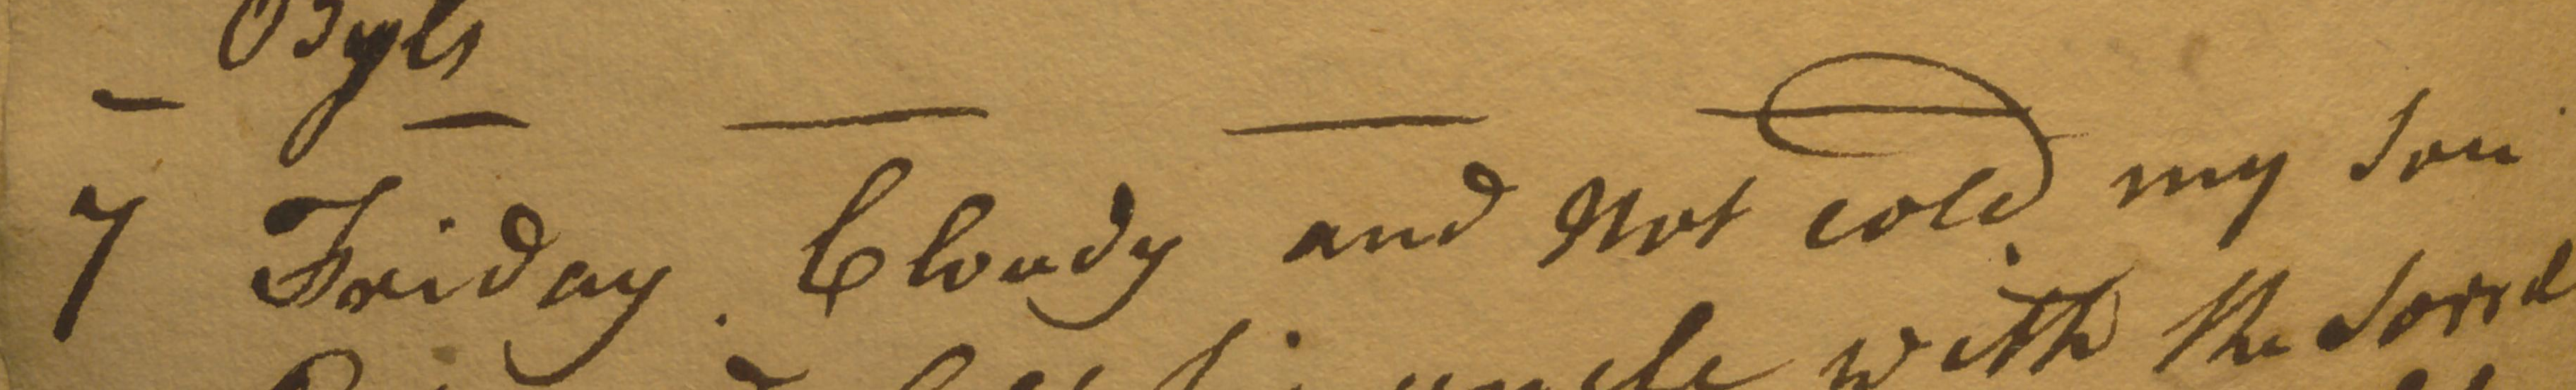7 Friday Cloudy and not cold my son
